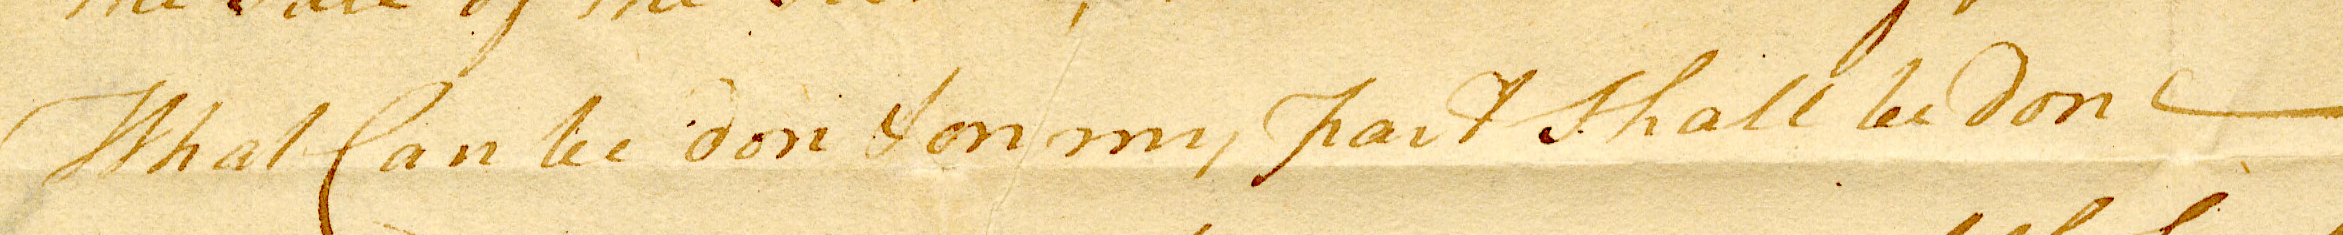What Can be don & on my part shall be done
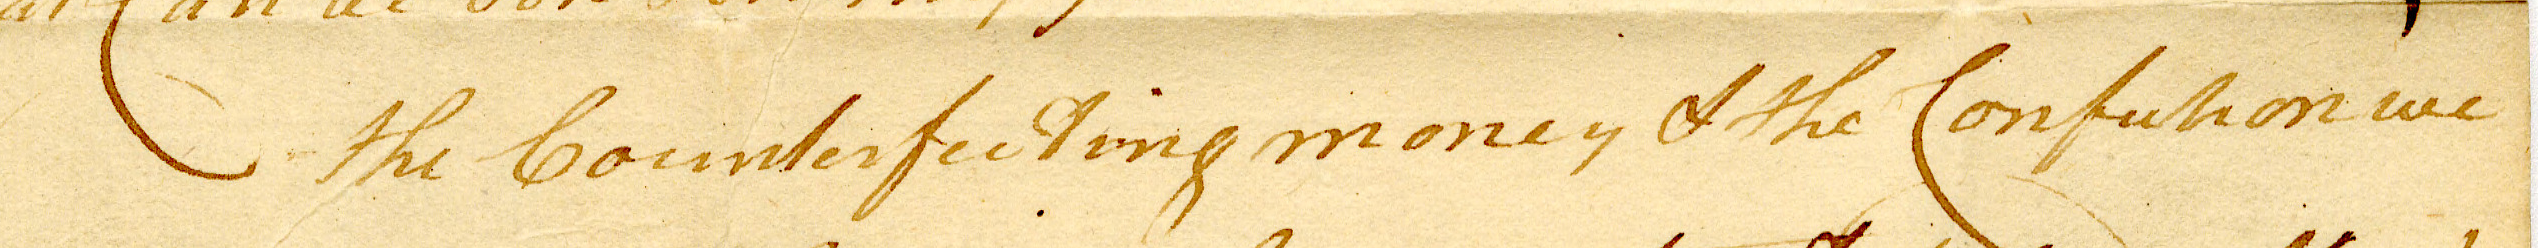the Counterfecting money & the Confusion we
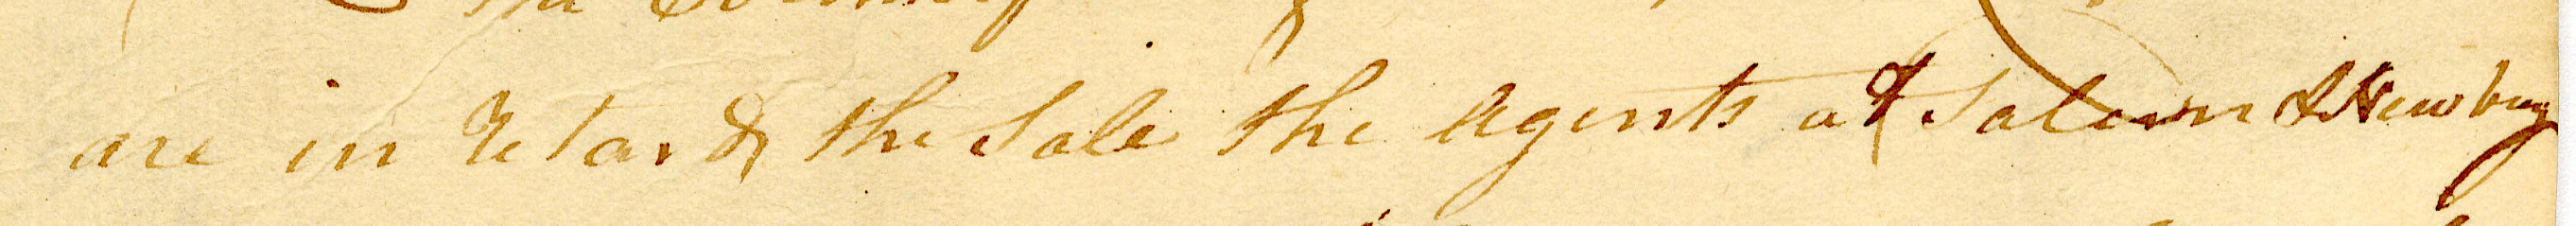are in retard the Sale the agents at Salem & Newbury
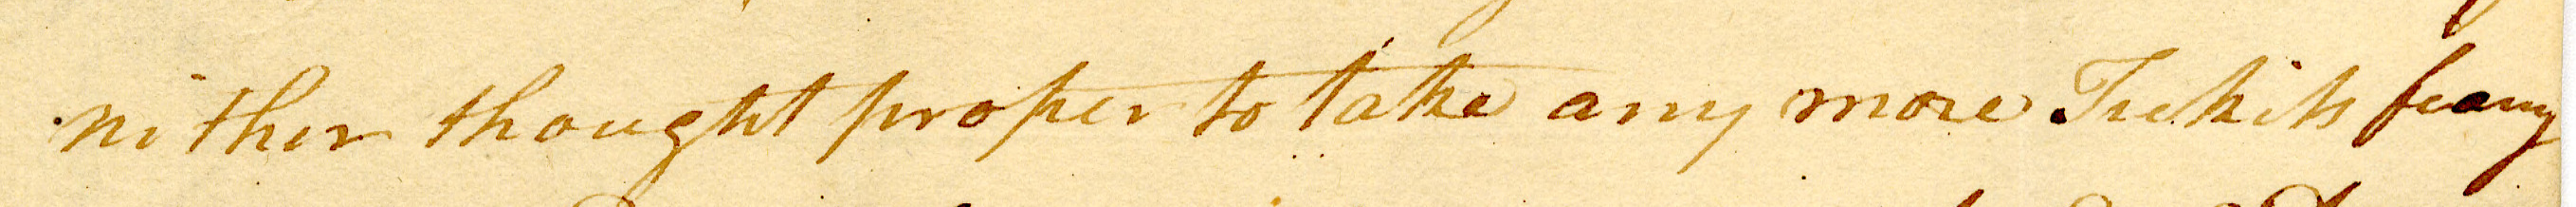neither thought proper to take any more Tickets fearing
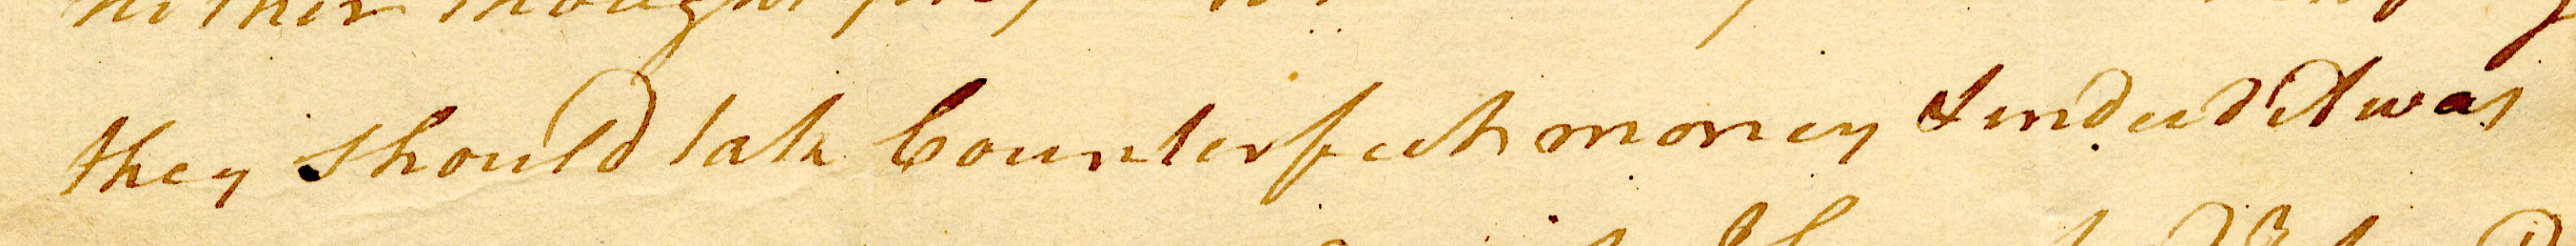they should take Counterfect money & indeed it was
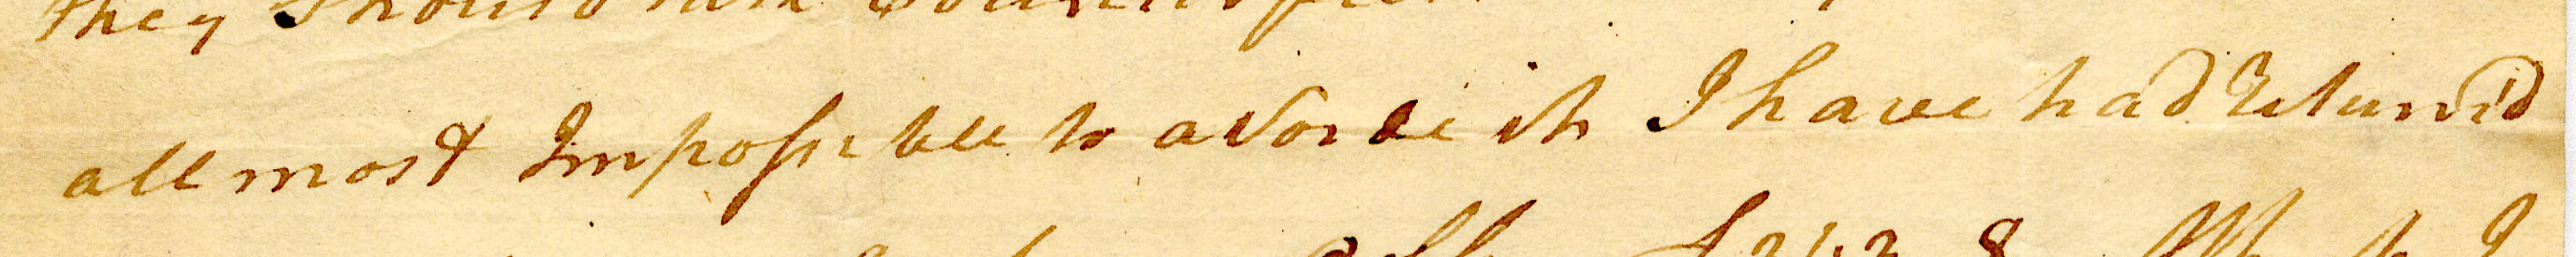allmost Impossible to avoid it I have had return'd
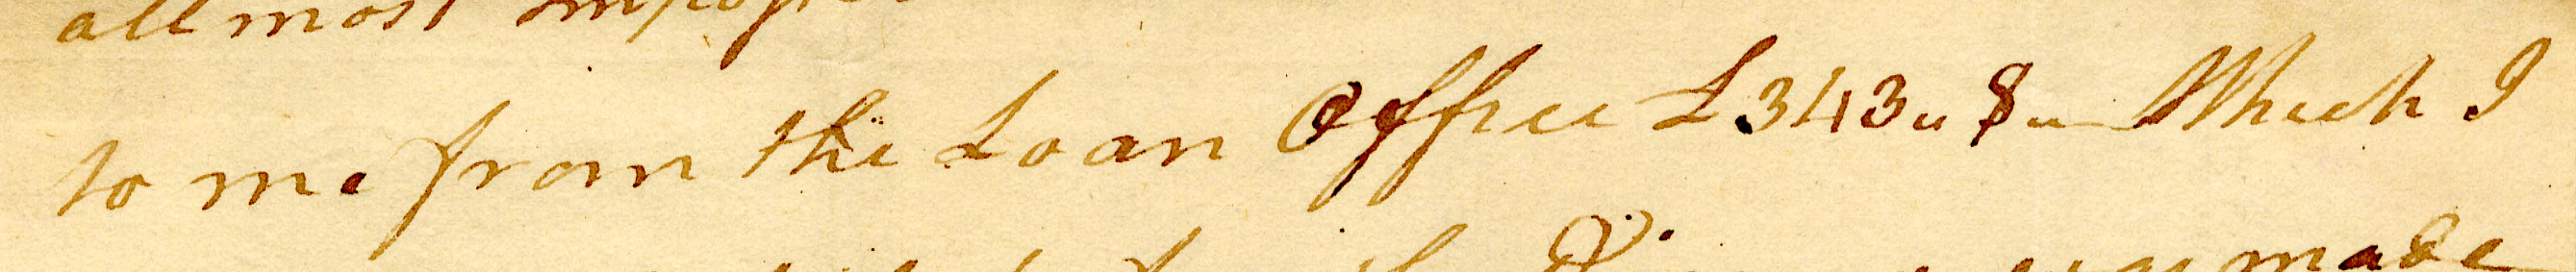to me from the Loan Office £343- $- Which I
